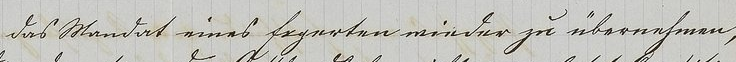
das Mandat eines Experten wieder zu übernehmen,
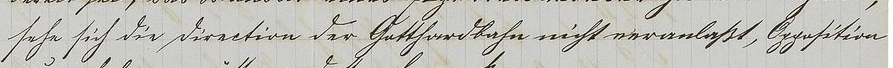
sehe sich die Direction der Gotthardbahn nicht veranlaßt, Opposition
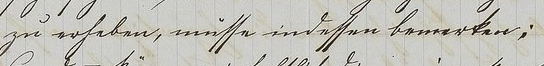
zu erheben, müsse indessen bemerken:
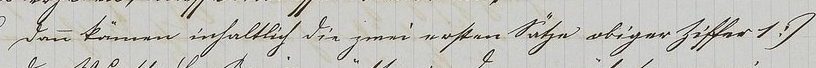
(dann kämen inhaltlich die zwei ersten Sätze obiger Ziffer 1)
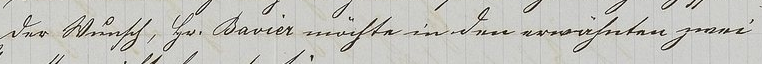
Der Wunsch, Hr. Bavier möchte in den erwähnten zwei
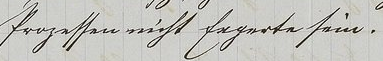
Prozessen nicht Experte sein.
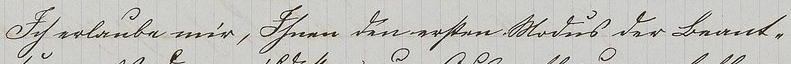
Ich erlaube mir, Ihnen den ersten Modus der Beant-
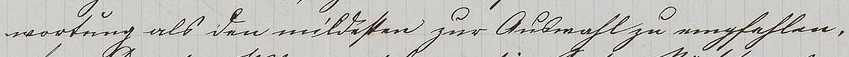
wortung als den mildesten zur Auswahl zu empfehlen.
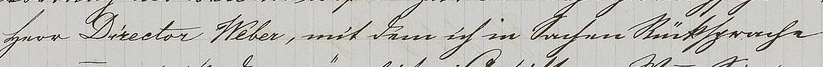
Herr Director Weber, mit dem ich in Sachen Rücksprache
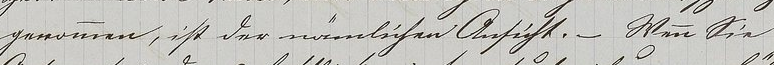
genommen, ist der nämlichen Ansicht. – Wenn Sie
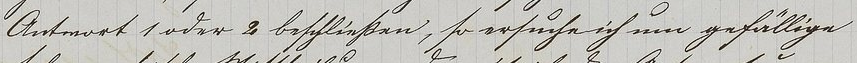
Antwort 1 oder 2 beschließen, so ersuche ich um gefällige
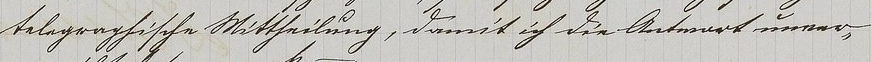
telegraphische Mittheilung, damit ich die Antwort unver-
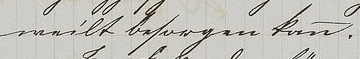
weilt besorgen kann.
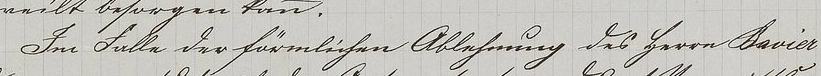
Im Falle der förmlichen Ablehnung des Herrn Bavier
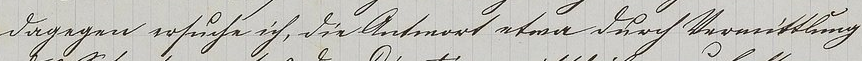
dagegen ersuche ich, die Antwort etwa durch Vermittlung
